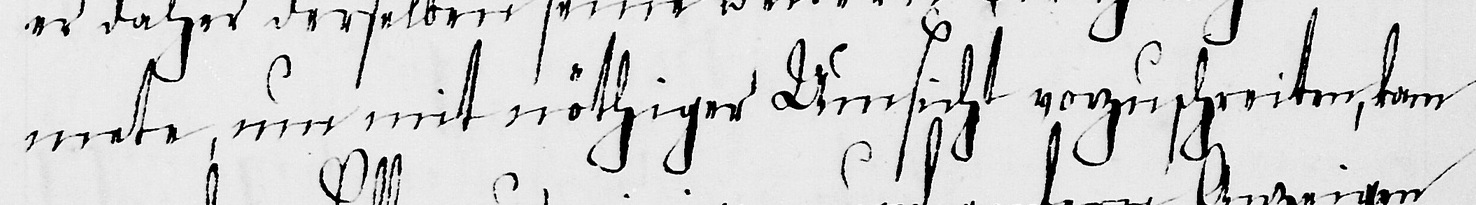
mete, um mit nöthiger Umsicht vorzuschreiten, kam
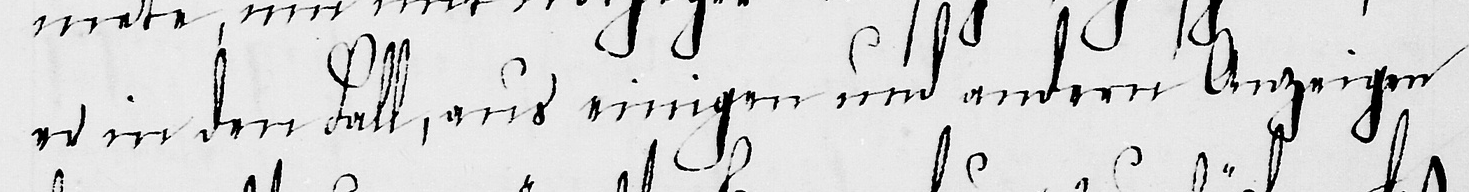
er in den Fall, aus einigen und andern Anzeigen
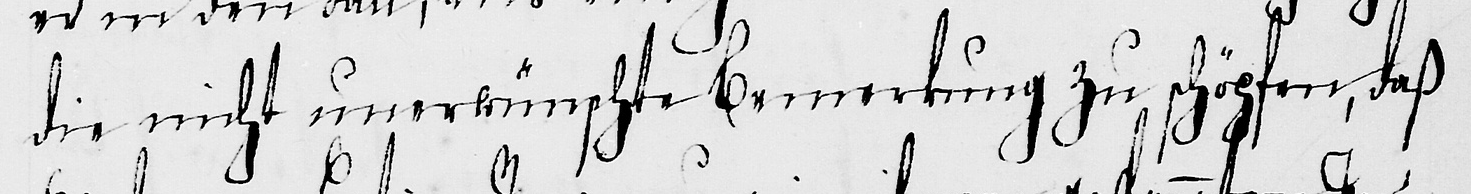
die nicht unerwünschte Bemerkung zu schöpfen, daß
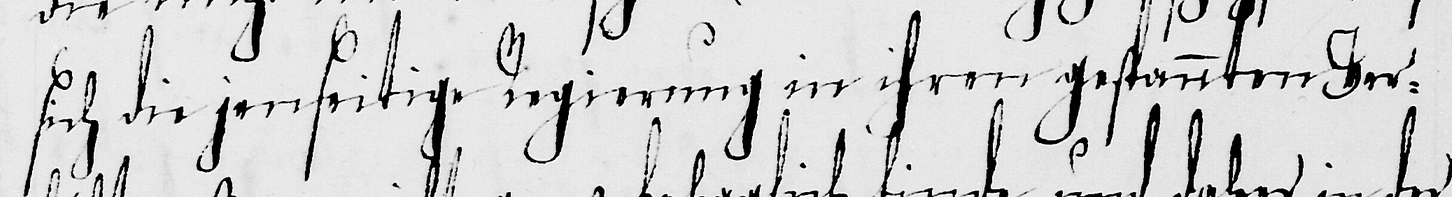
ich die jenseitige Regierung in ihren gespannten Ver¬
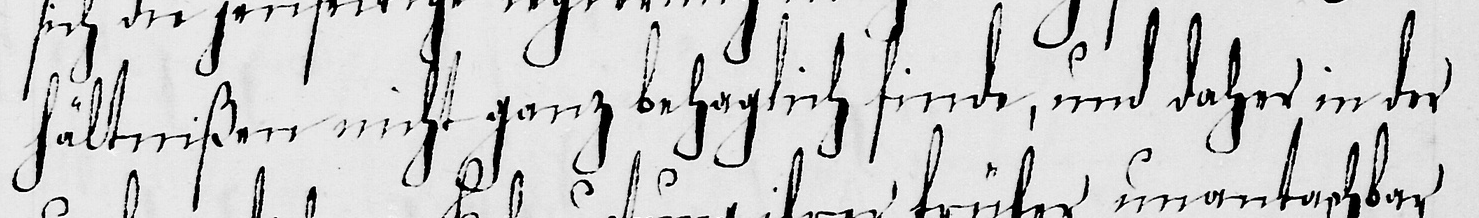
hältnißen nicht ganz behaglich finde, und daher in der
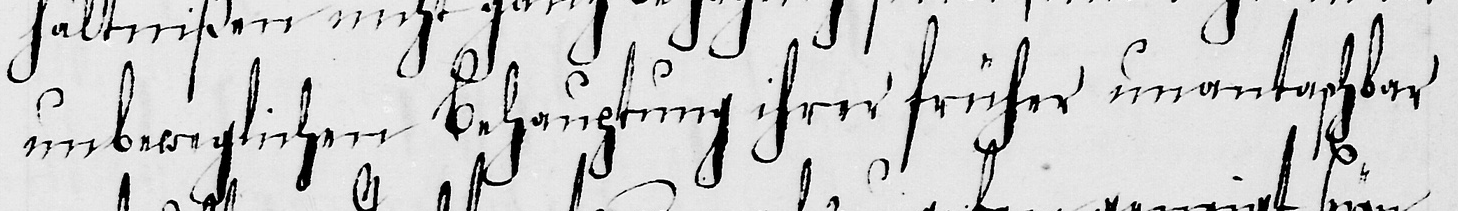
unbeweglichen Behauptung ihrer früher unantaschbar
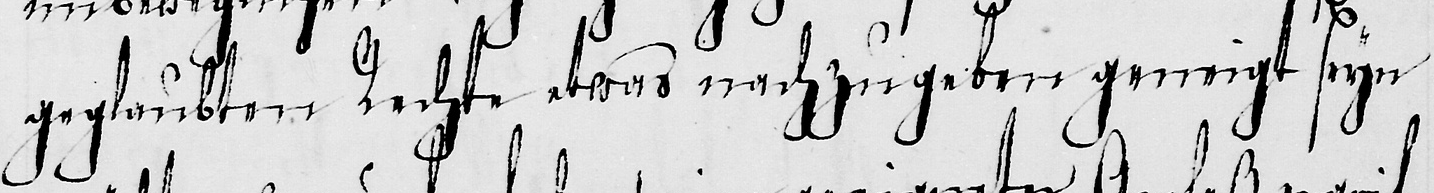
geglaubten Rechte etwas nachzugeben geneigt seyn
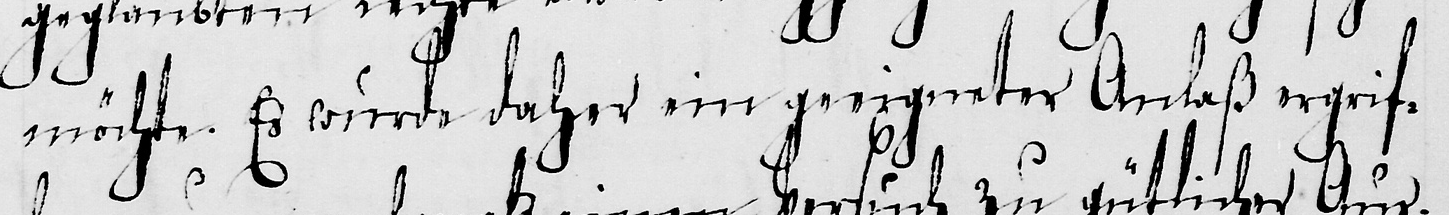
möchte. Es wurde daher ein geeigneter Anlaß ergrif¬
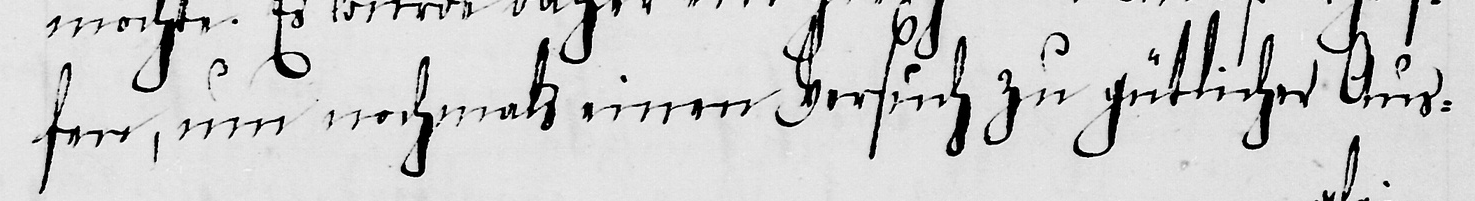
fen, um nochmals einen Versuch zu gütlicher Aus-
